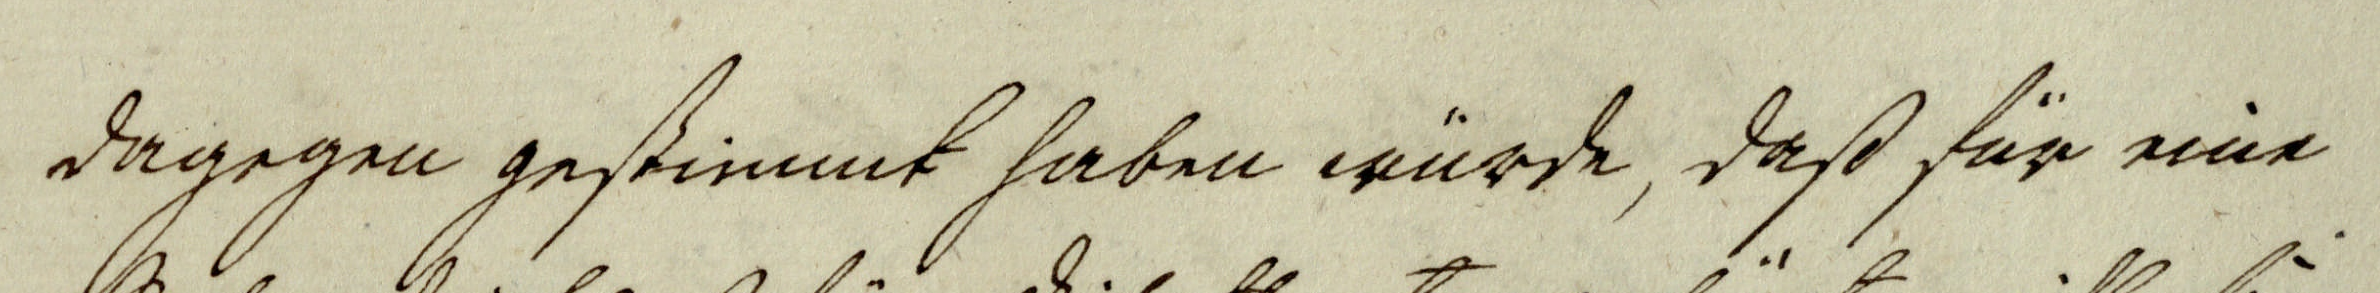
dagegen gestimmt haben würde, daß für eine
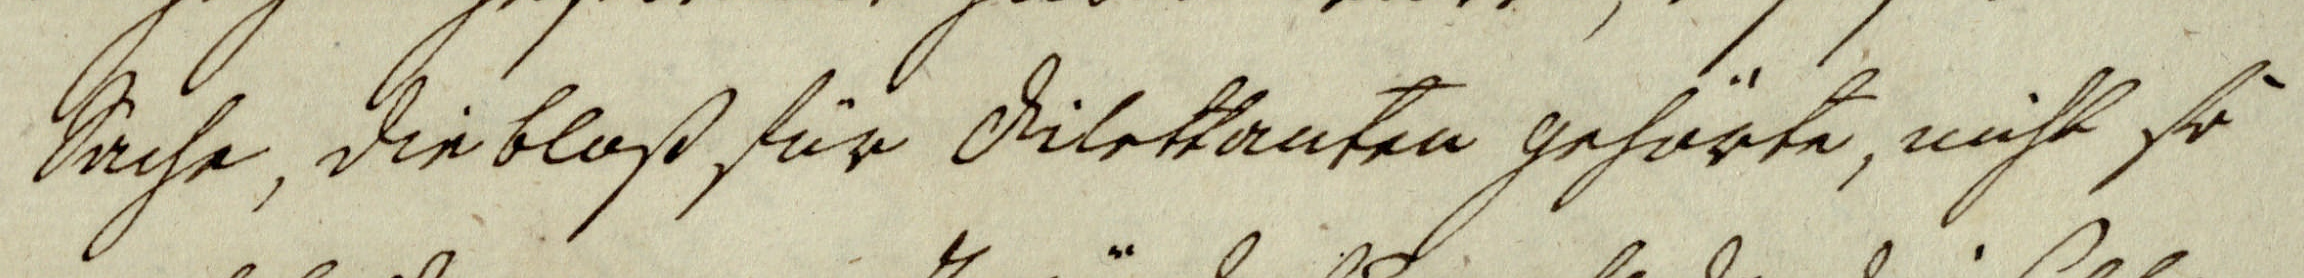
Sache, die bloß für Dilettanten gehörte, nicht so
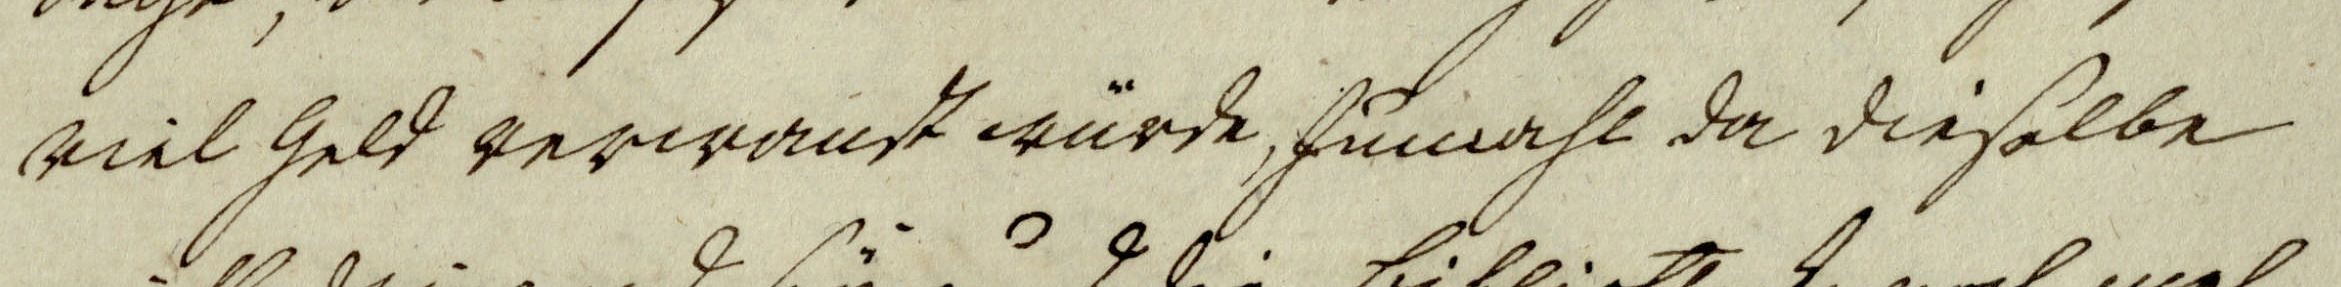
viel Geld verwandt würde, zumahl da dieselbe
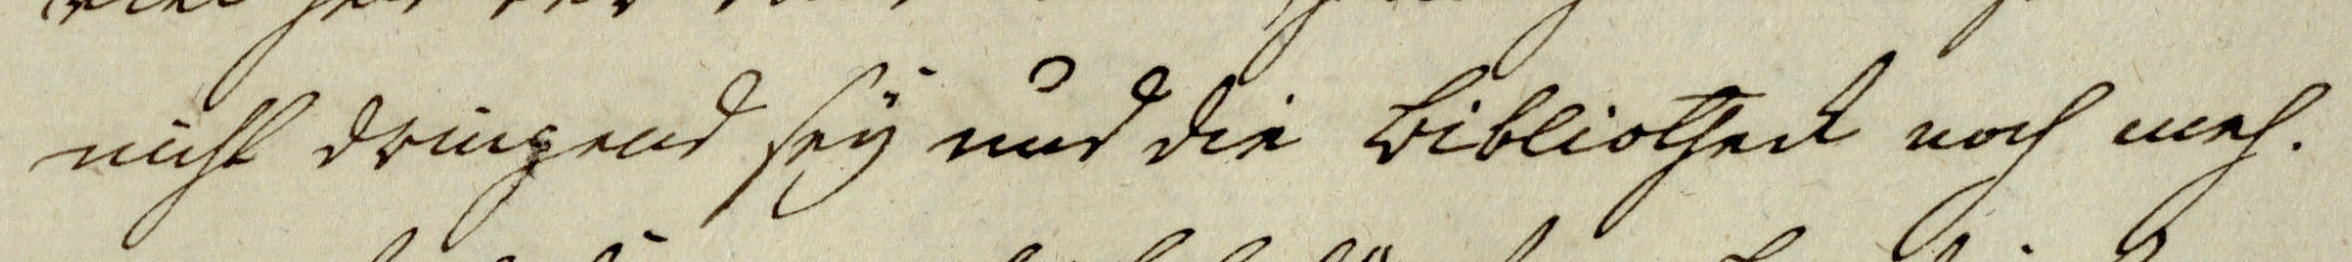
nicht dringend seÿ und die Bibliothek noch meh¬
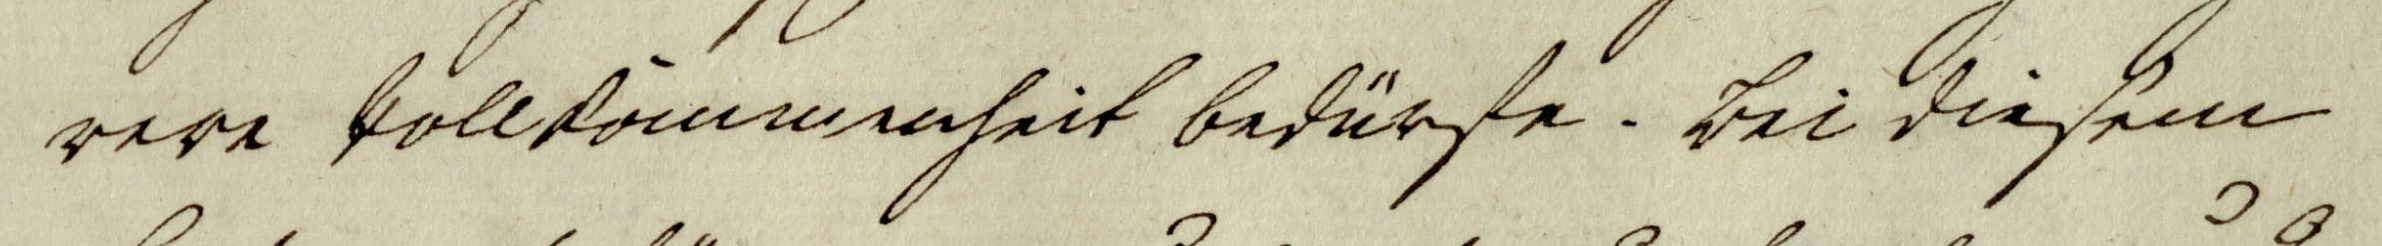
rere Vollkommenheit bedürfe. Bei diesem
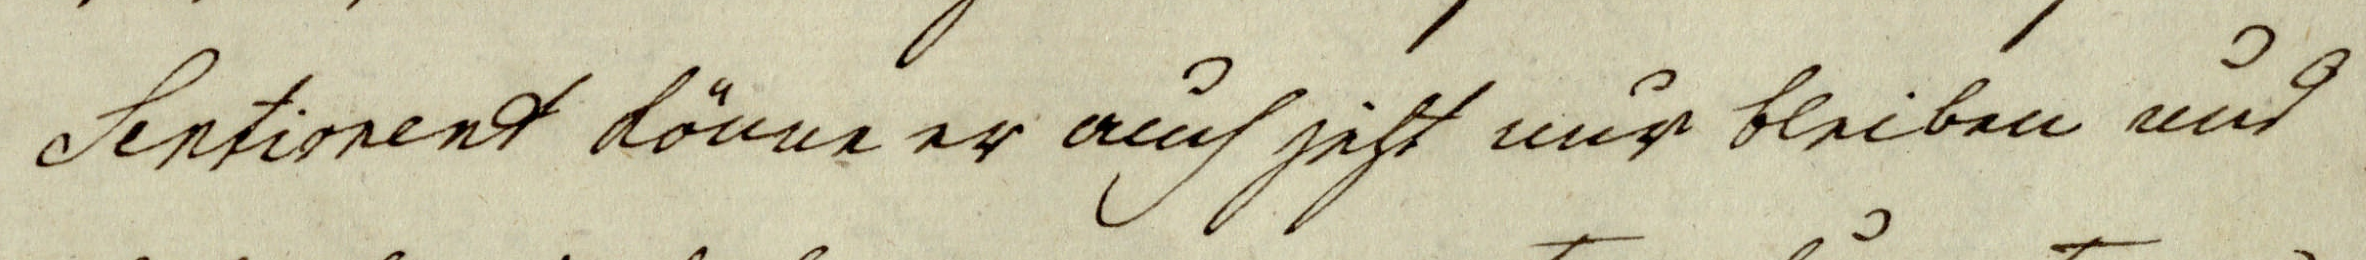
Sentiment könne er auch jetzt nur bleiben und
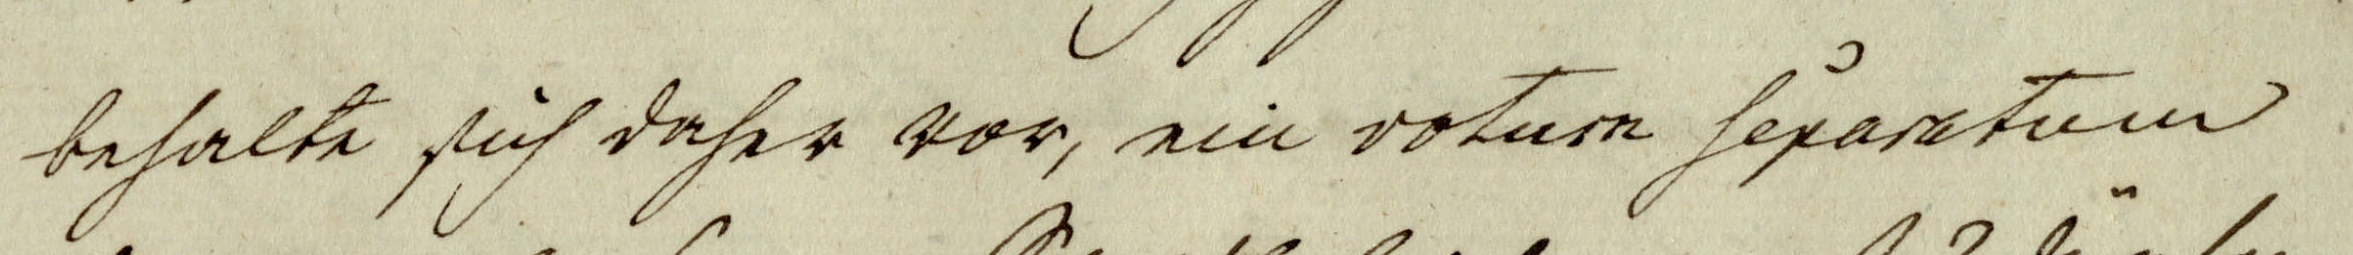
behalte sich daher vor, ein votum separatum
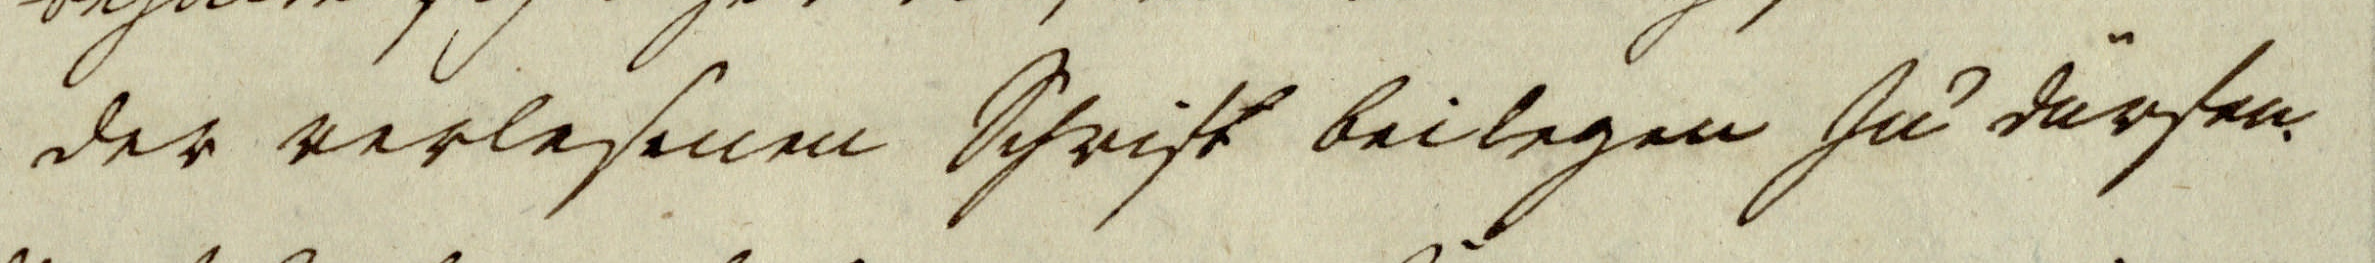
der verlesenen Schrift beilegen zu dürfen.
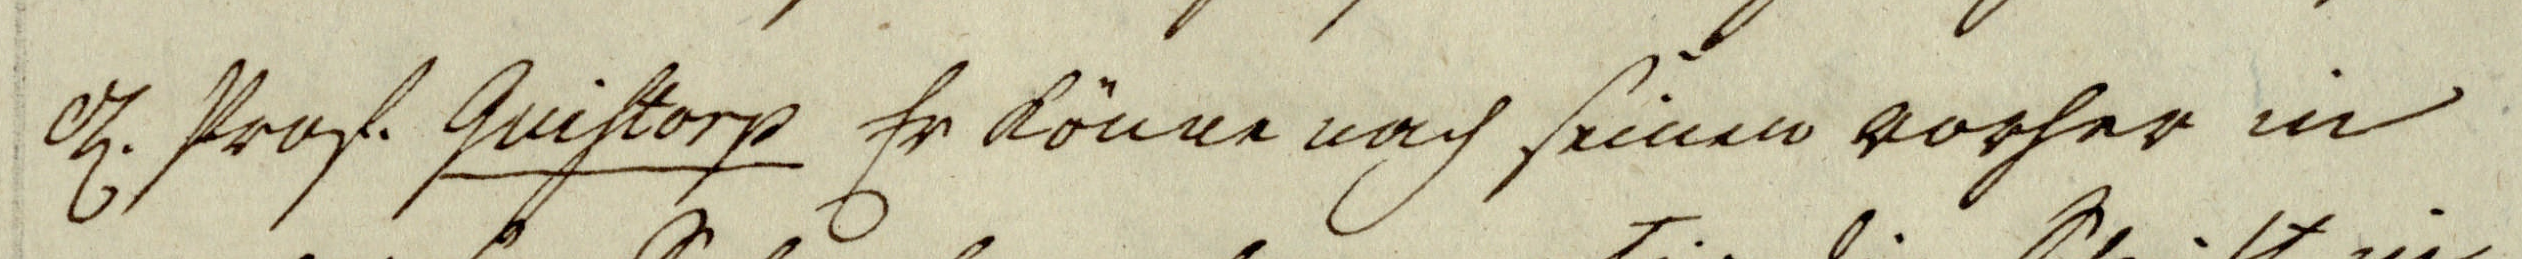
dh. Prof. Quistorp Er könne nach seinen vorher in
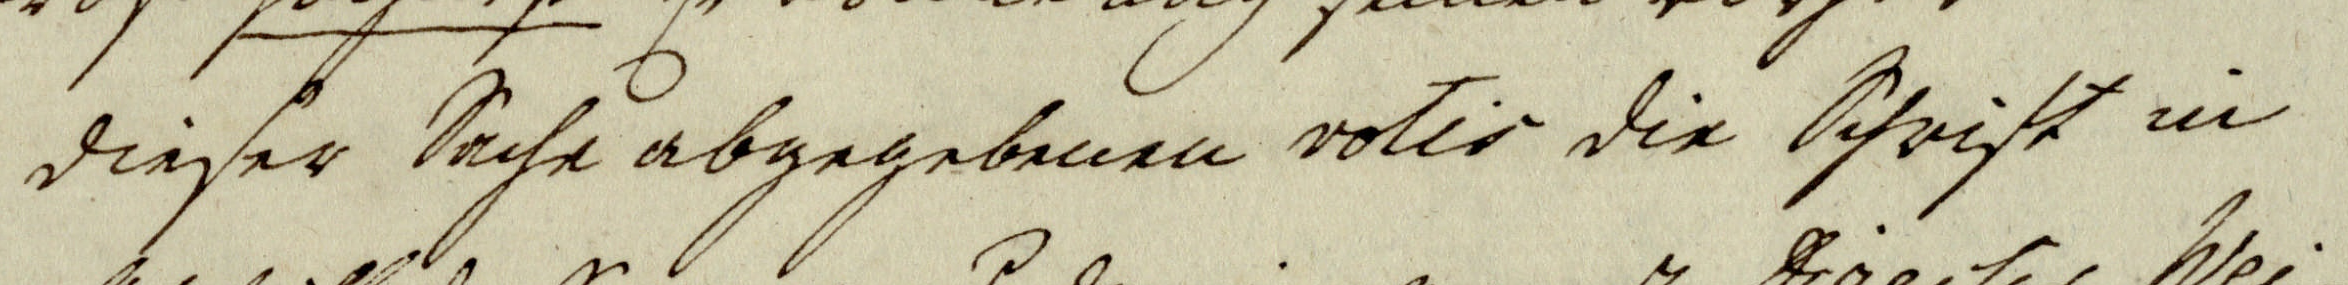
dieser Sache abgegebenen votis die Schrift in
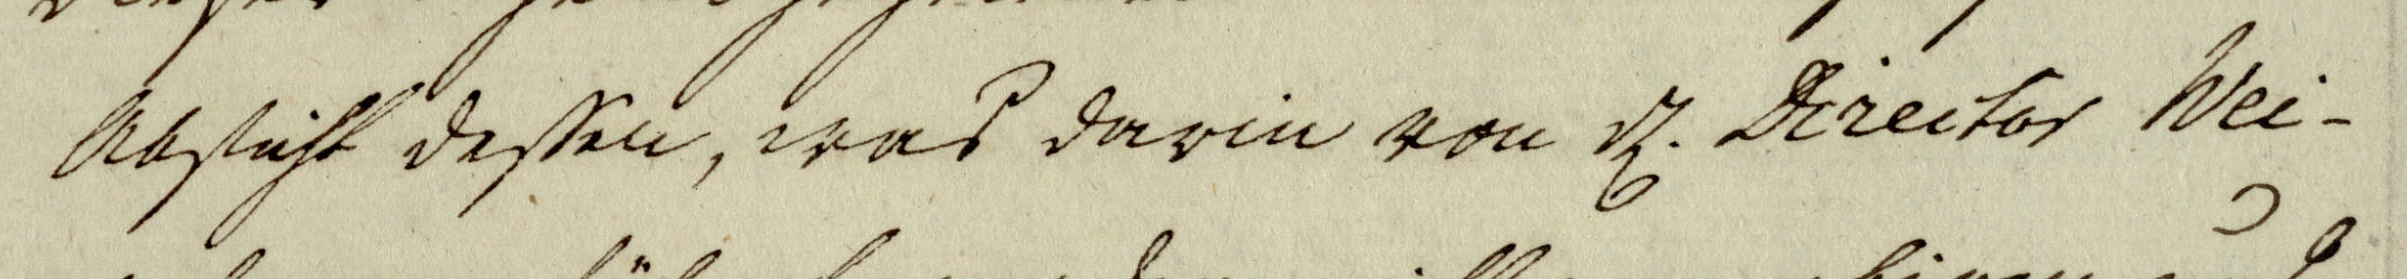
Absicht dessen, was darin von dh. Director Wei¬
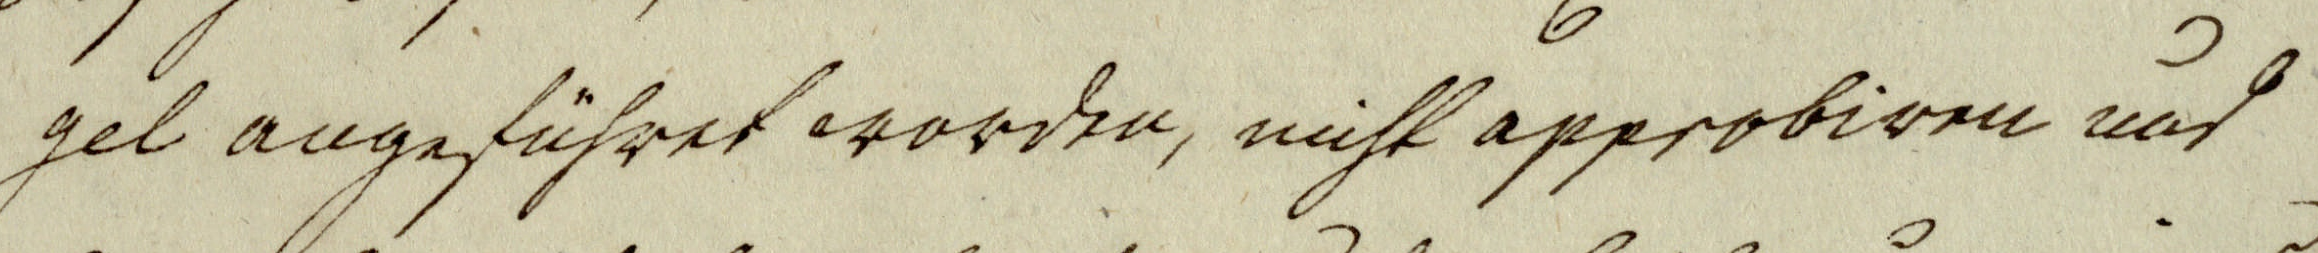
gel angeführet worden, nicht approbiren und
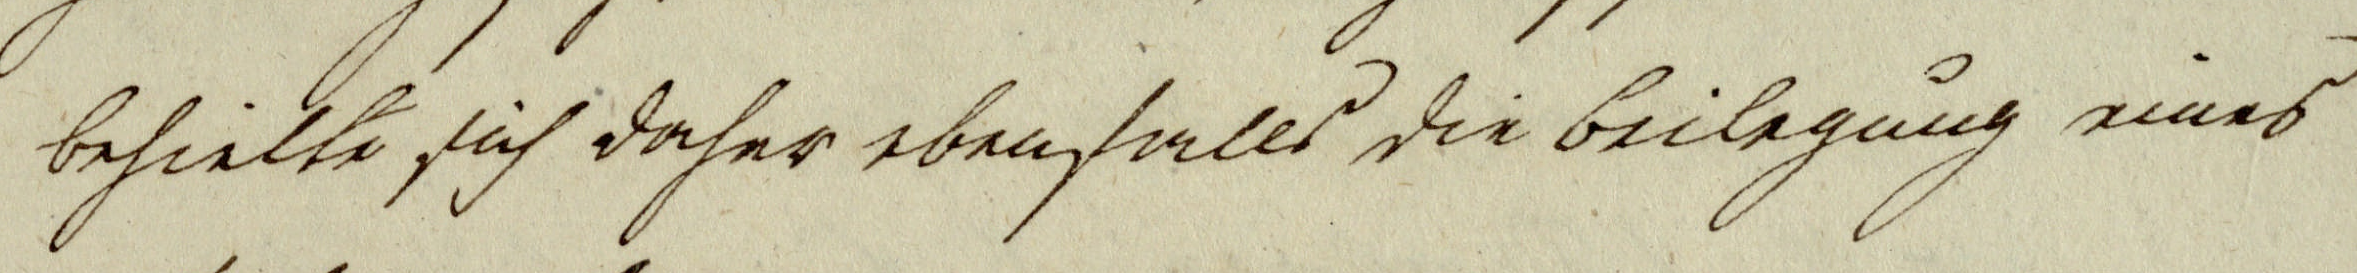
behielte sich daher ebenfalls die Beilegung eines
